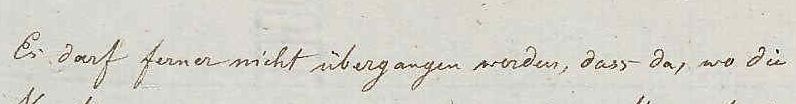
Es darf ferner nicht übergangen werden, dass da, wo die
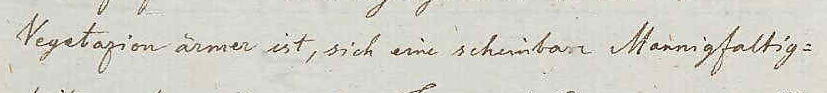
Vegetazion ärmer ist, sich eine scheinbare Mannigfaltig-
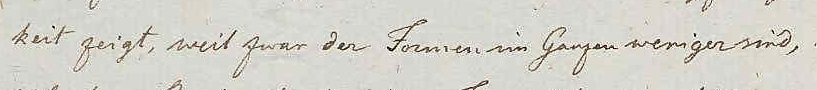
keit zeigt, weil zwar der Formen im Ganzen weniger sind,
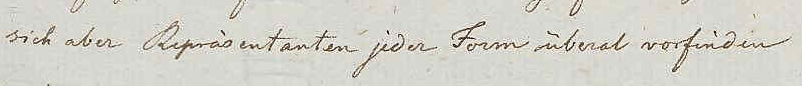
sich aber Repräsentanten jeder Form überal vorfinden
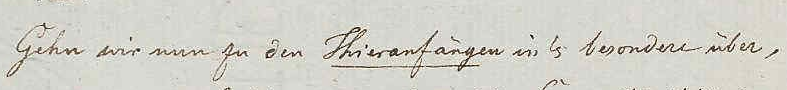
Gehn wir nun zu den Thieranfängen in's besondere über,
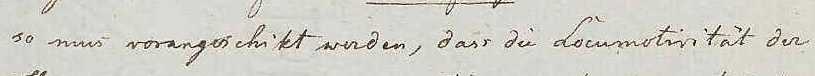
so mus vorangeschikt werden, dass die Locumotivität der
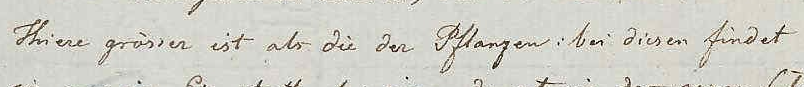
Thiere grösser ist als die der Pflanzen: bei diesen findet
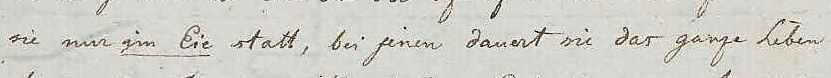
sie nur im Eie statt, bei jenen dauert sie das ganze Leben
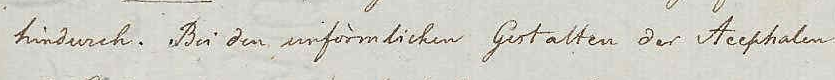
hindurch. Bei den unförmlichen Gestalten der Acephalen
